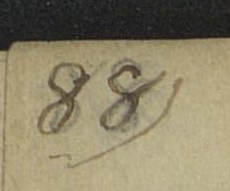88
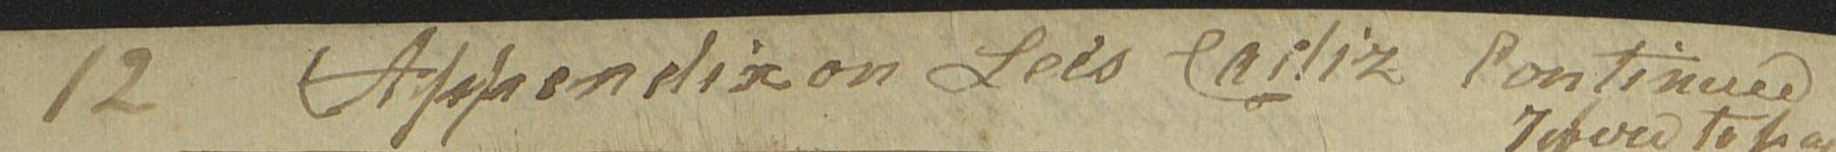12 Appendix on Lee's Cadiz Continued
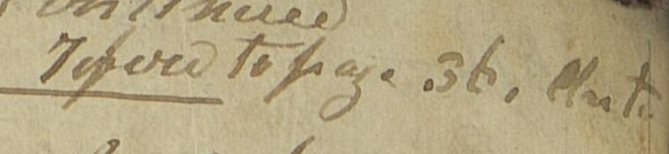Reperd to page 36, Ante
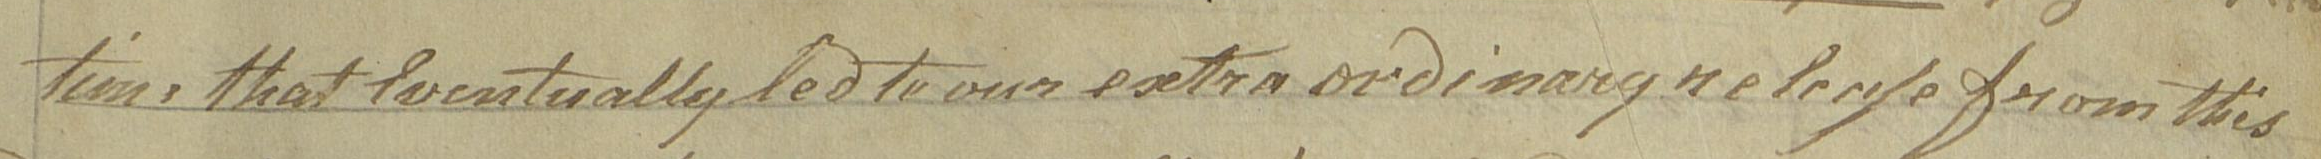time that Eventually led to our extra ordinary release from this
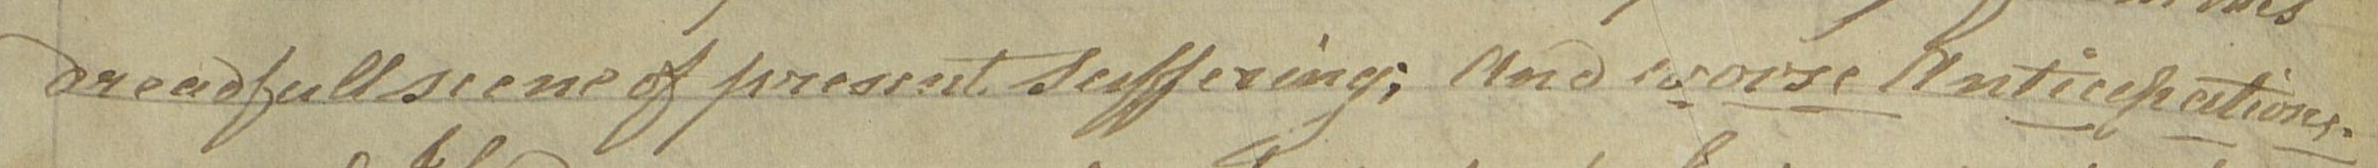dreadfull scene of present suffering; And worse Anticipations
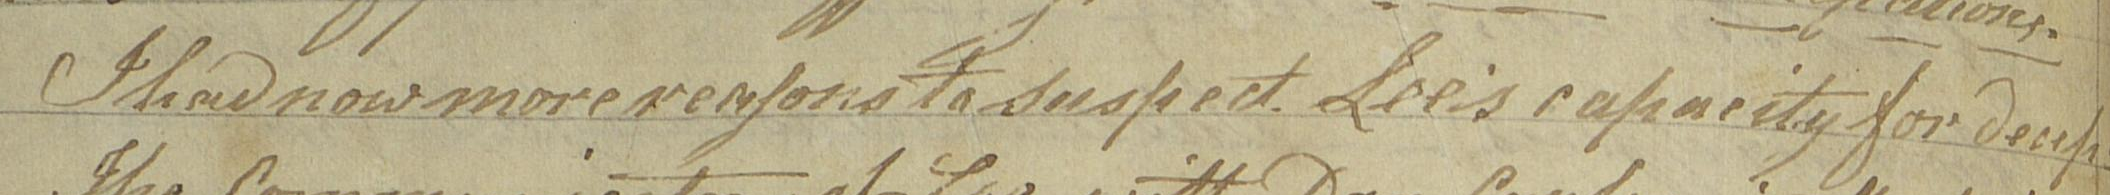I had now more reasons to suspect Lee's capacity for decep-
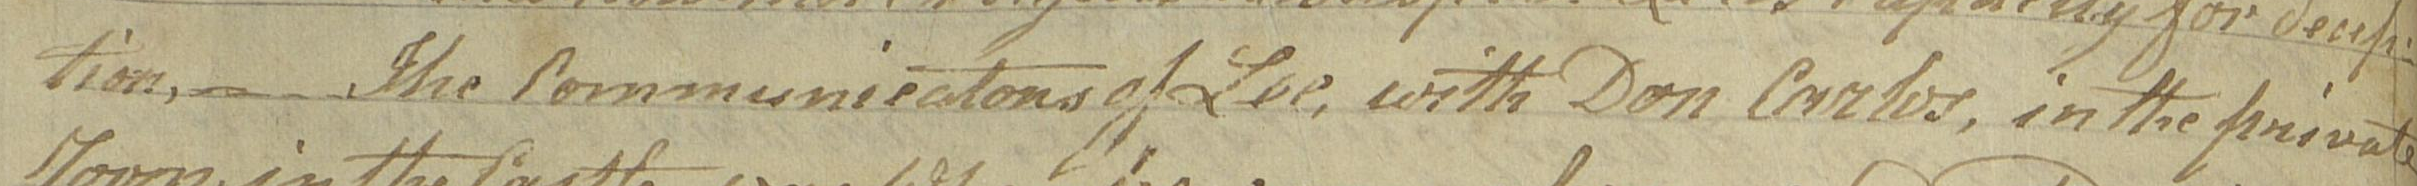tion, The Communicatons of Lee, with Don Carlos, in the private
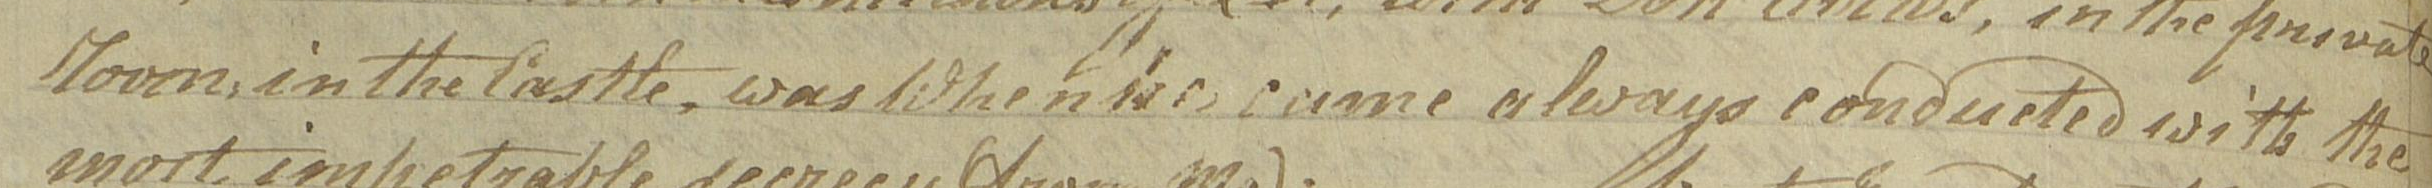Novn, in the Castle was Whense came always conducted with the
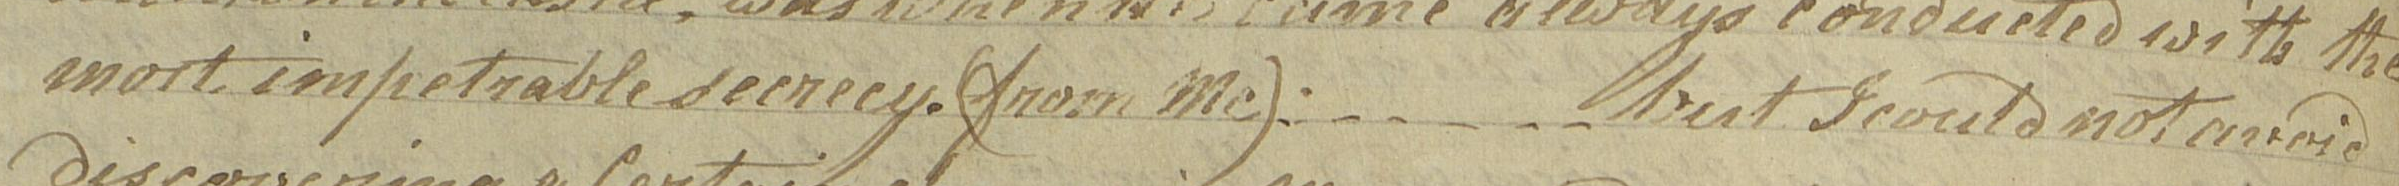most impetrable secrecy. (from Me): but I could not avoid
